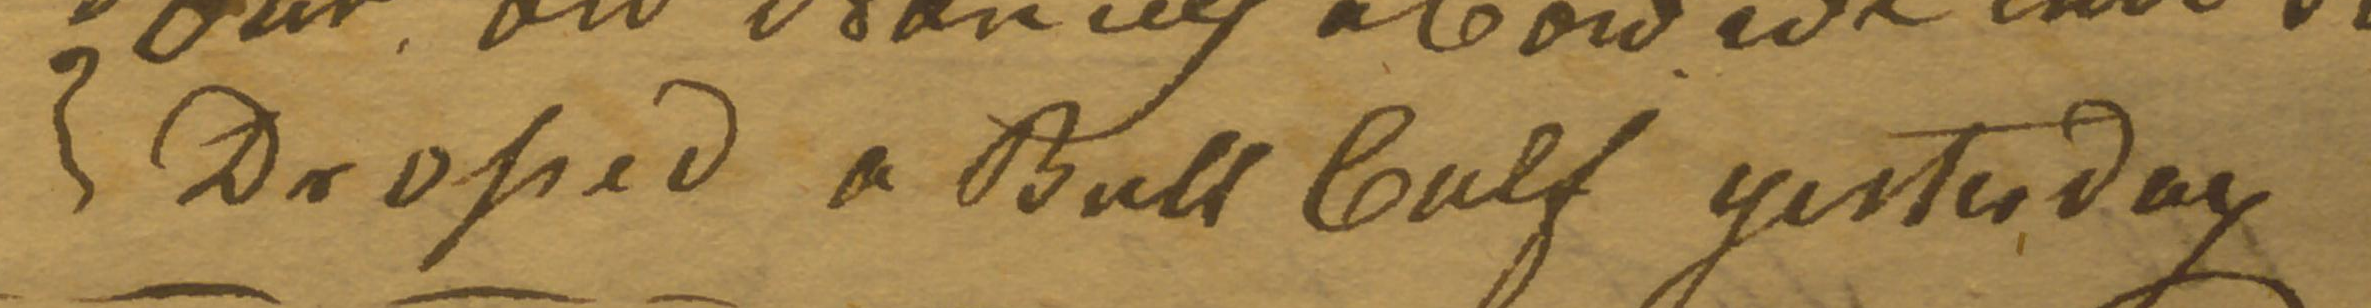Droped a Bull Calf yesterday
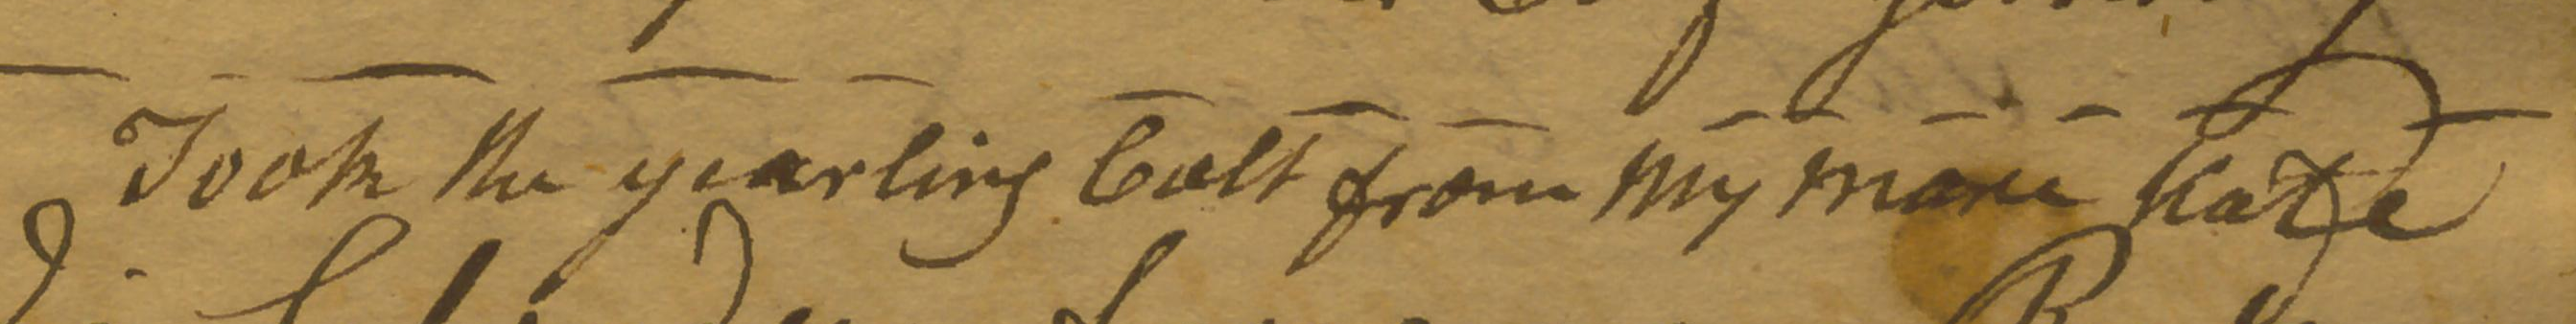Took the yearling Colt from my mare Kate
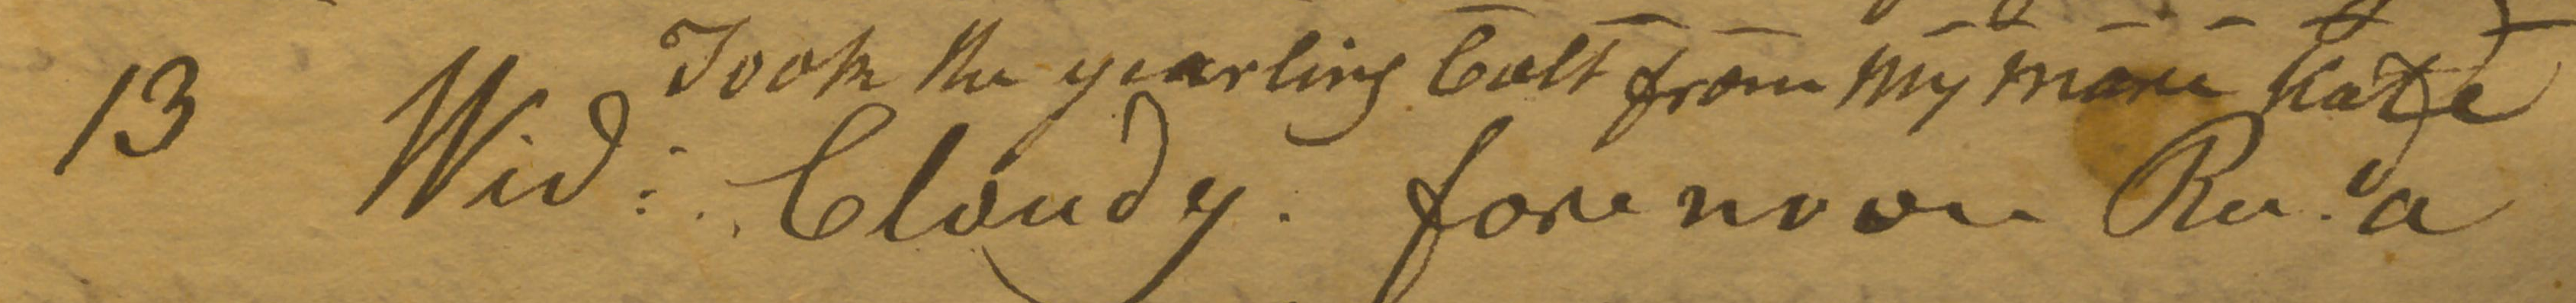13 Wed: Cloudy. forenoon Rec^d a
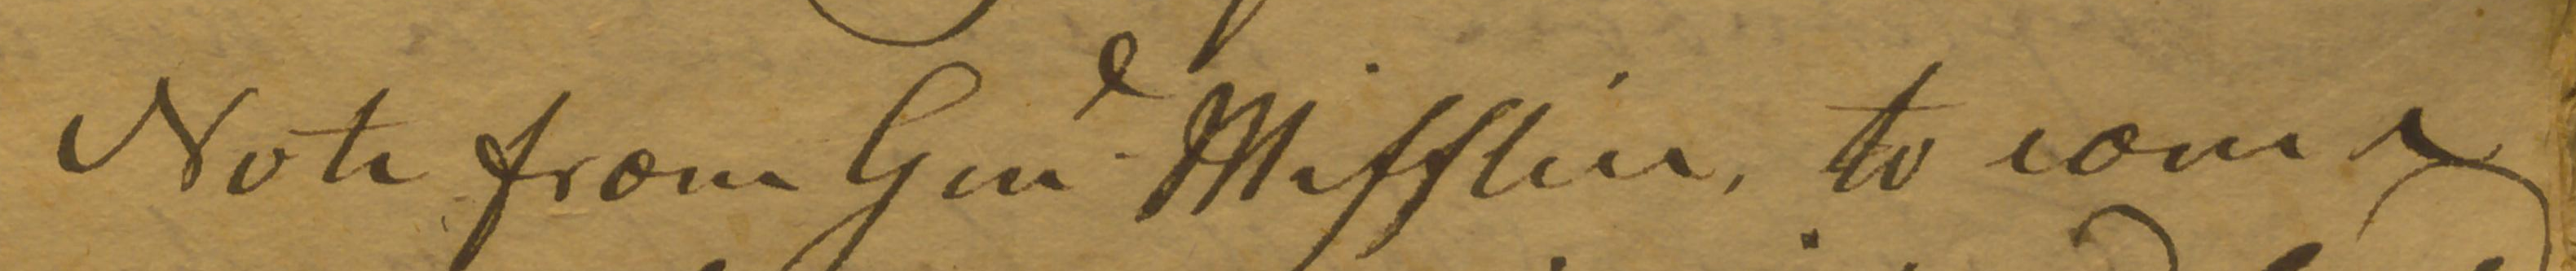Note from Gen^l. Mifflin, to come
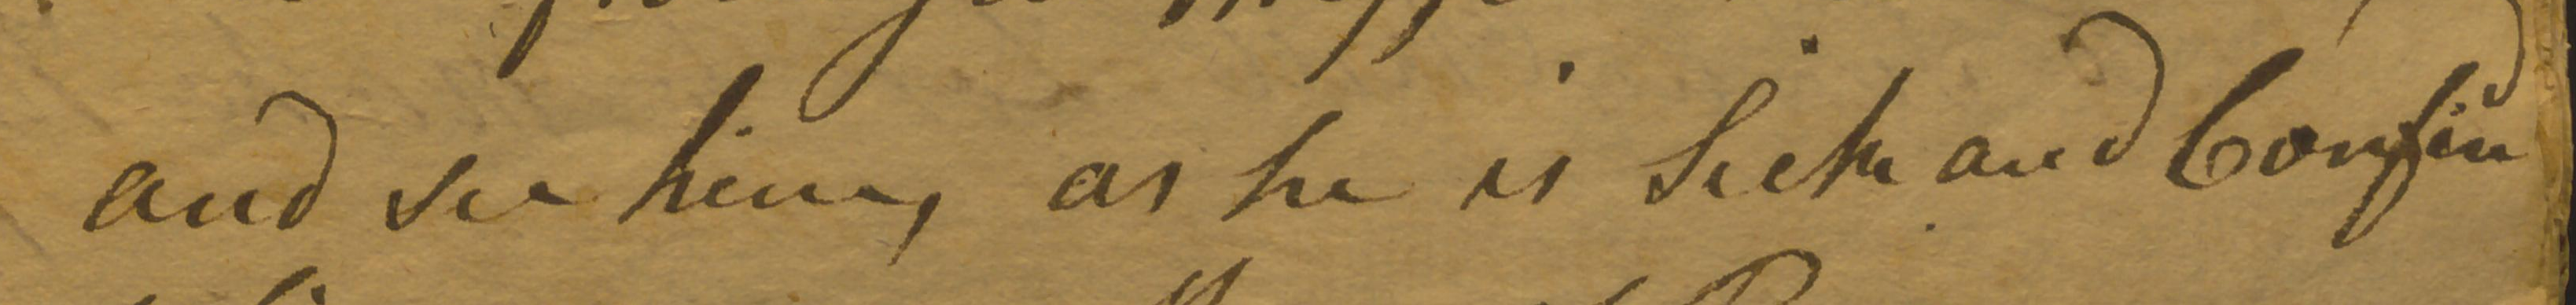and see him, as he is Sick and Confine^d
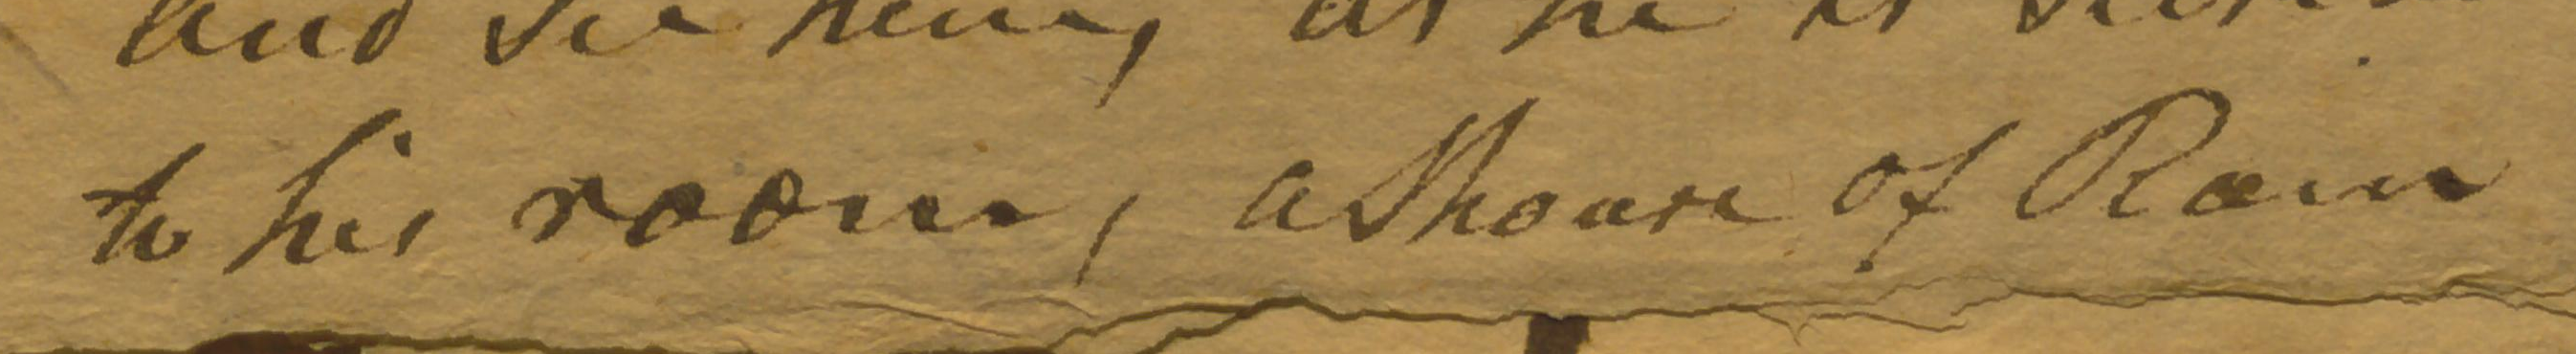to his room, a shoure of Rain
